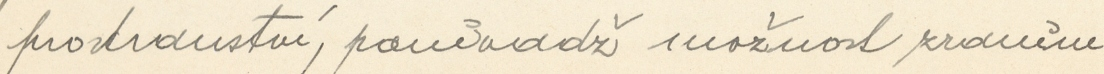prostranství, poněvadž možnost zranění
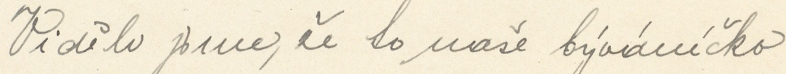Viděli jsme, že to naše býváníčko
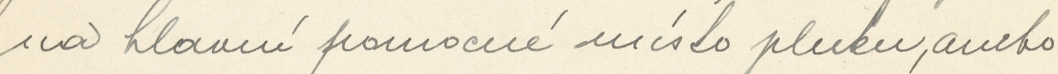na hlavní pomocné místo pluku, anebo
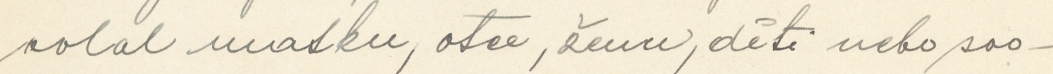volal matku, otce, ženu, děti nebo svo-
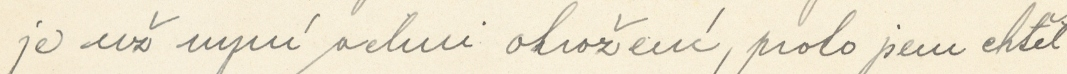je už nyní velmi ohrožené, proto jsem chtěl
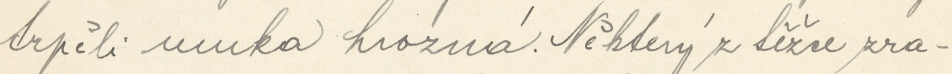trpěli muka hrozná. Některý z těžce zra-
